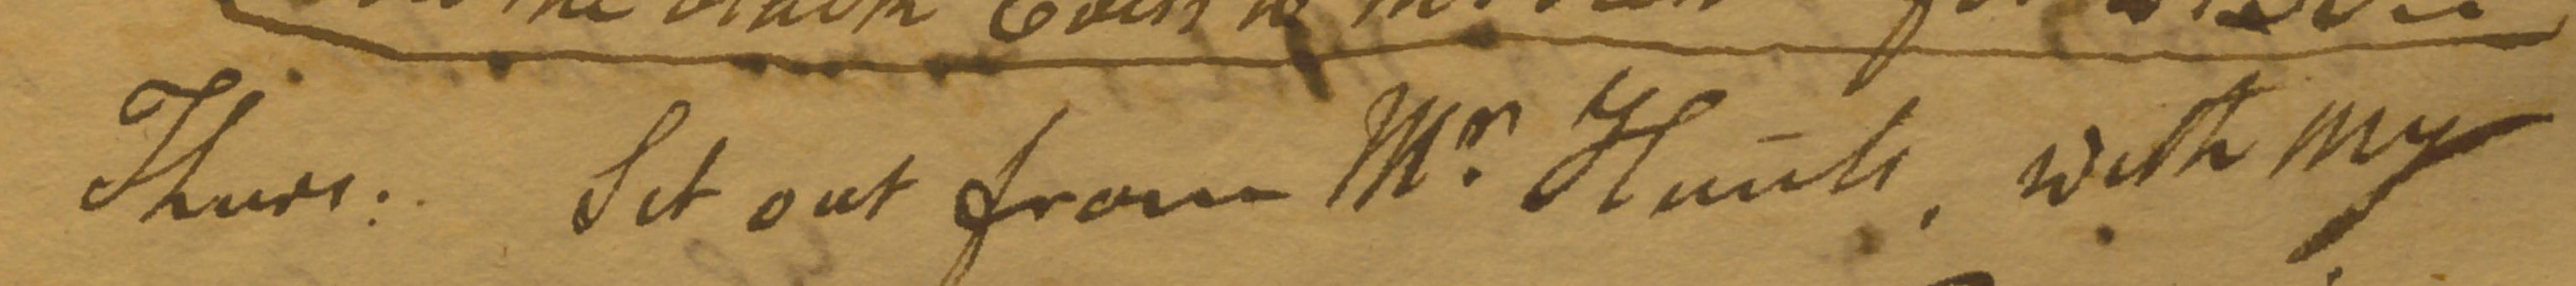Thurs. Set out from M^r. Hunts with my
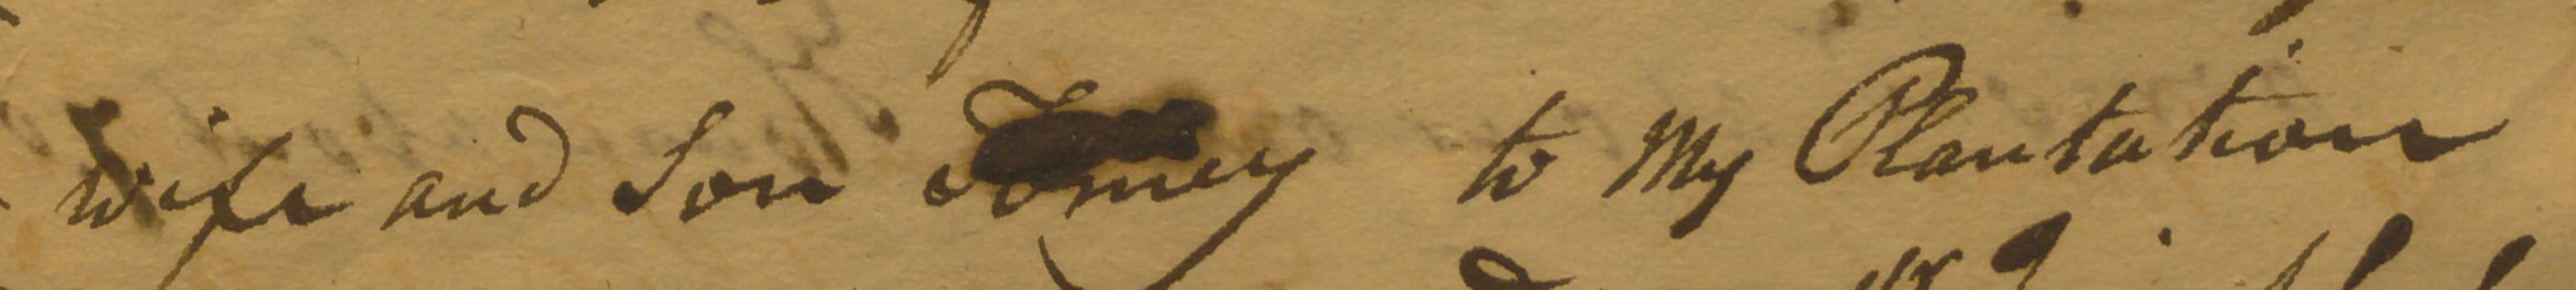wife and Son Tomey to My Plantation
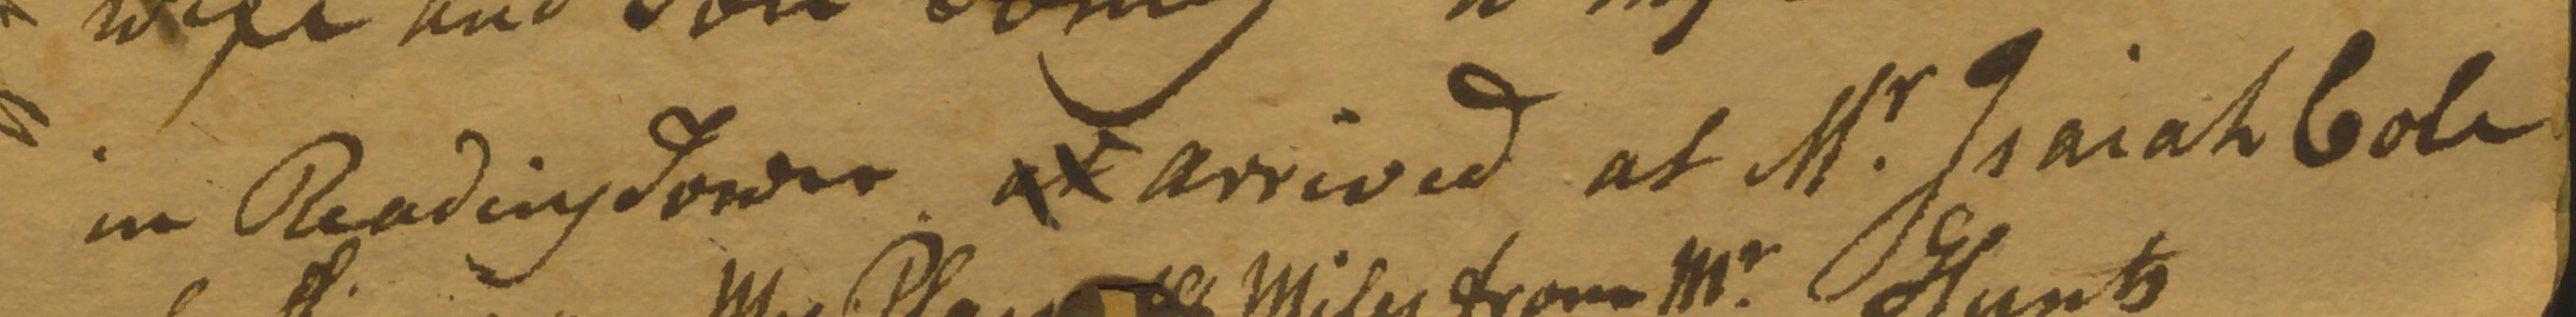in ReadingTown, [at] arrived at M^r. Isarah Cole
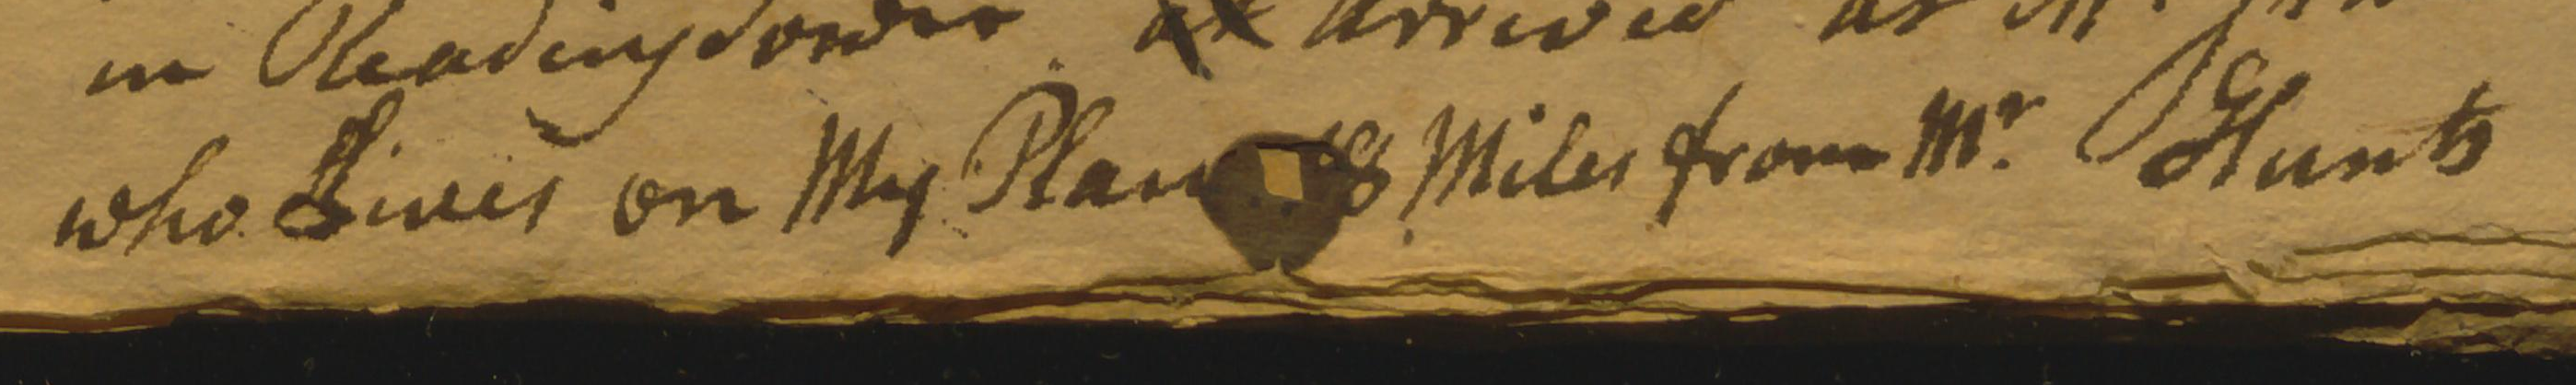who Lives on My Plan [1]8 Miles from M^r. Hunts
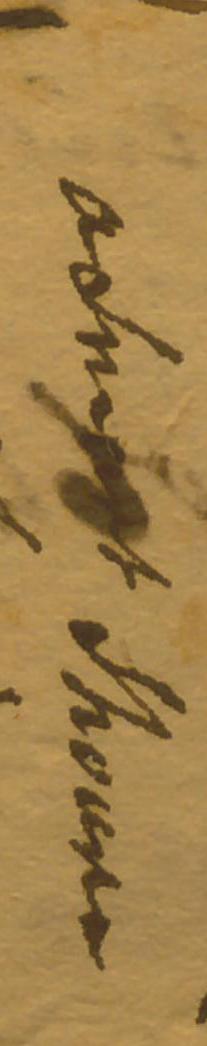acmpt Shoure
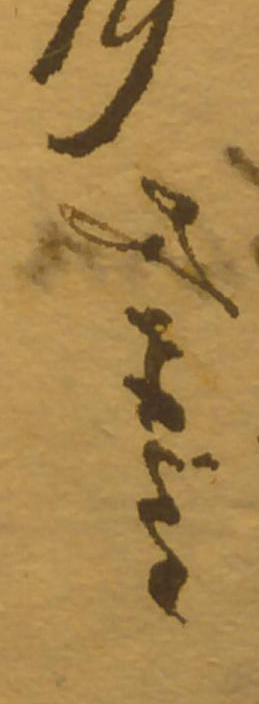of rain
